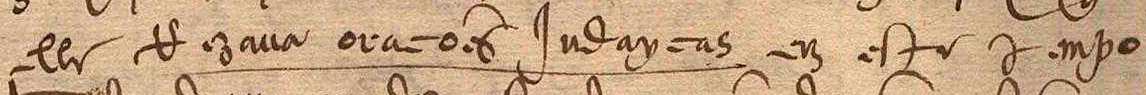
elle Rezaua oraçoẽs Judaycas em este tempo
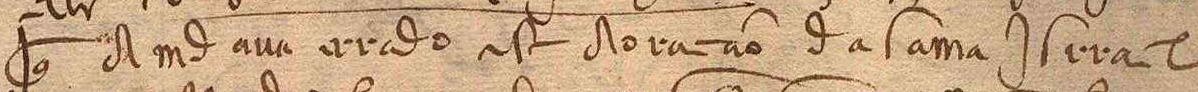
q̄ Amdaua errado -s- A oraçaõ da sama Jsrrael
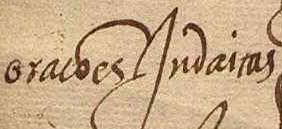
orações Judaicas
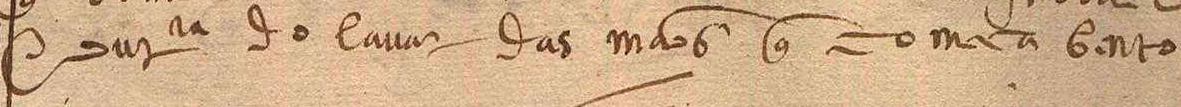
e outra do lauar das mãos q̄ começa bento
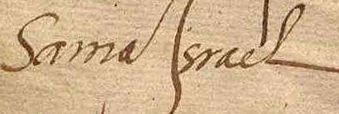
Sama Jsrael
